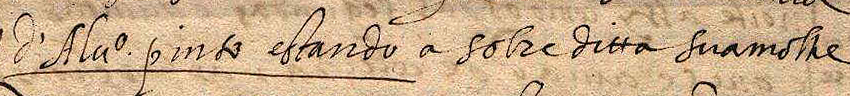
d'Aluo. pinto estando a sobreditta sua molher
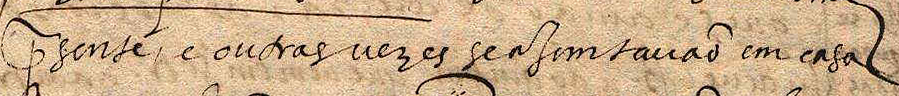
p̄sente, e outras uezes se aJuntauaõ em casa
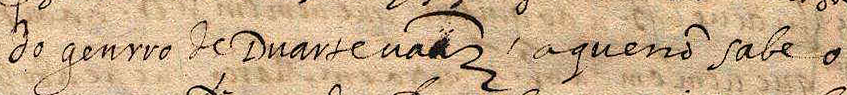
do genrro de Duarte uaāz, a que nō sabe o
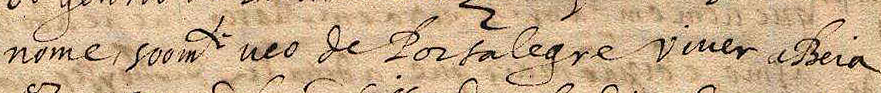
nome, soomte ueo de Portalegre viuer a Beia
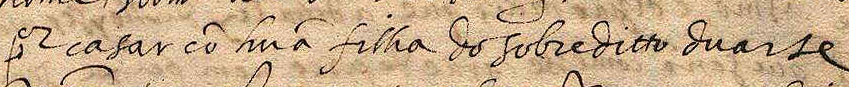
por casar cō huā filha do sobreditto duarte
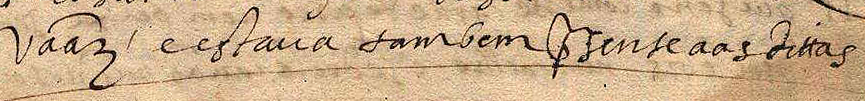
Vaāz, e estaua tambem p̄sente aas dittas
